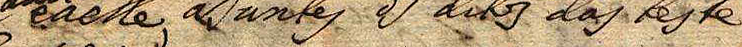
e a elle, aIuntej os ditos das teste
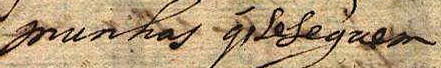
munhas q̄ se seguem
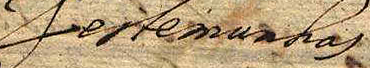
Testemunhas
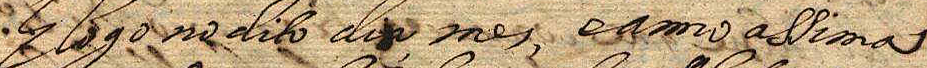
E logo no dito dia, mes, e anno assima
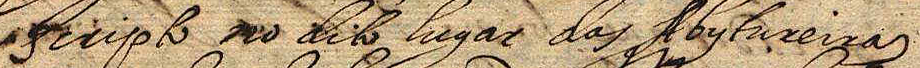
escripto no dito lugar das Abytureiras
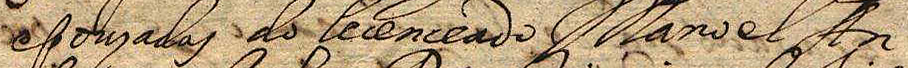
e pouzadas do lecenceado Manoel An
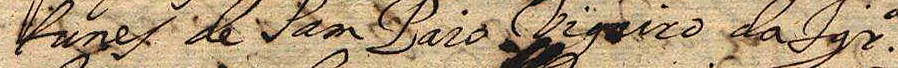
tunes de Sam Paio Vigairo da Igr.a
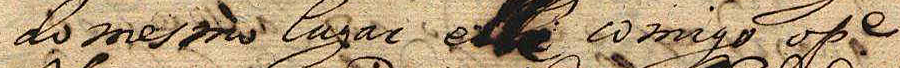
do mesmo lugar elle comigo o p.e
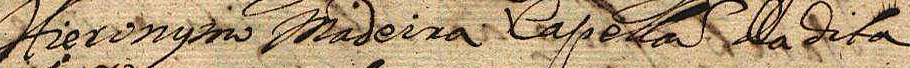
Hieronymo madeira Capellaõ da dita
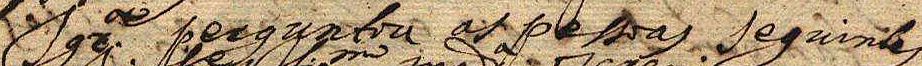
Igr.a perguntou as pessoas seguintes
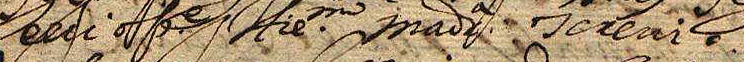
e eu o p.e Hie.mo madr.a screui
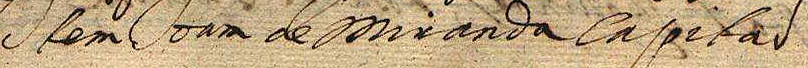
Item Ioam de miranda Capitaõ
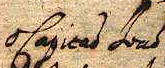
o Capitaõ Ioaõ
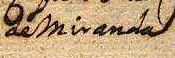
de Miranda
